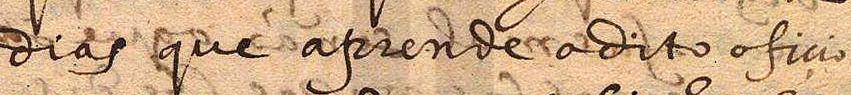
dias que aprende o dito oficio
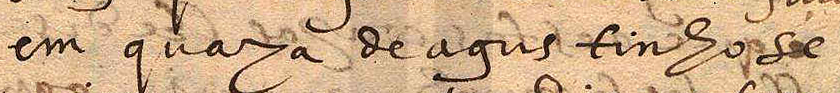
em quaza de agustinho se
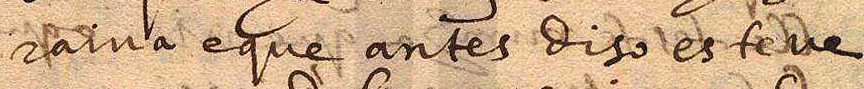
raiua e que antes diso esteue
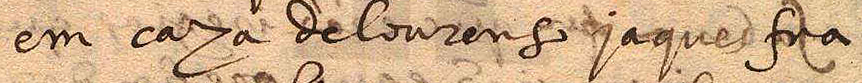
em caza de lourenso jaques fra
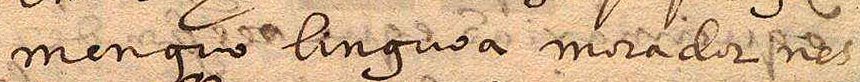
menguo linguoa morador nes
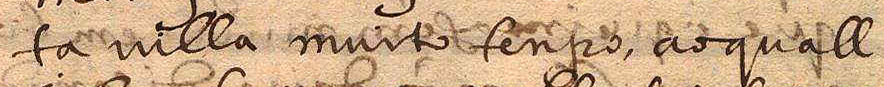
ta uilla muito tenpo, ao quall
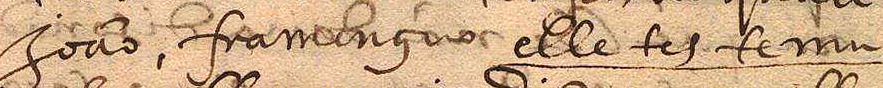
João, framenguo elle testemu
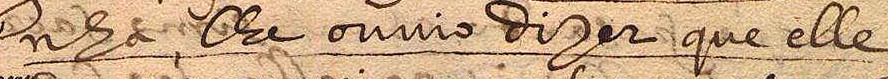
nha lhe ouuio dizer que elle
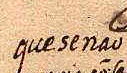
que se naõ
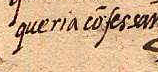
queria cōfessar
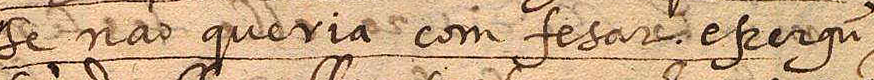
se naõ queria comfesar e pergū
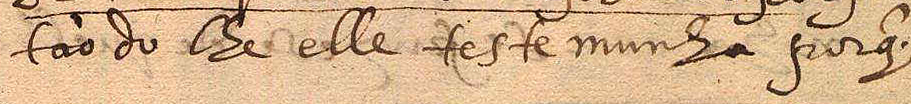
tãodo lhe elle testemunha porq̄.
